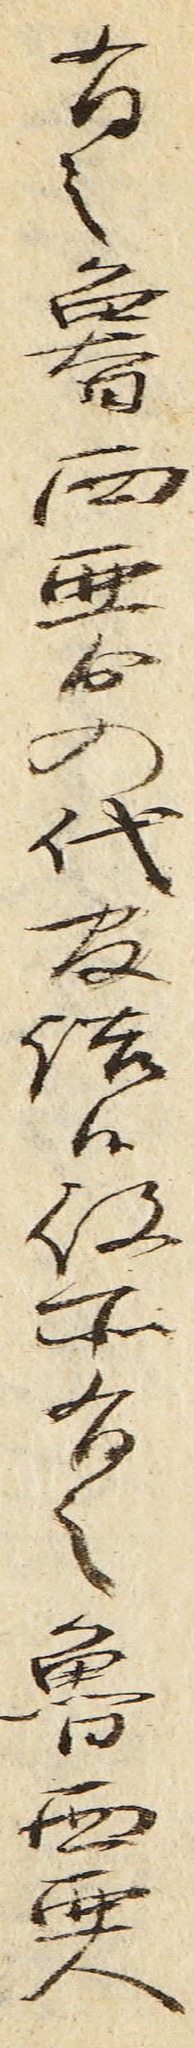有之魯西亜ゟの代官詰候役所有之魯西亜人
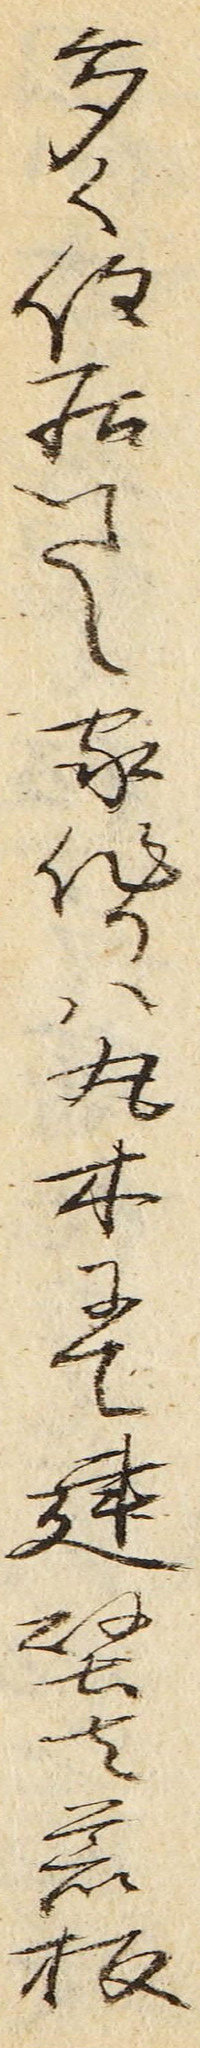多く住居いたし家作りは丸木にて建壁は荒板

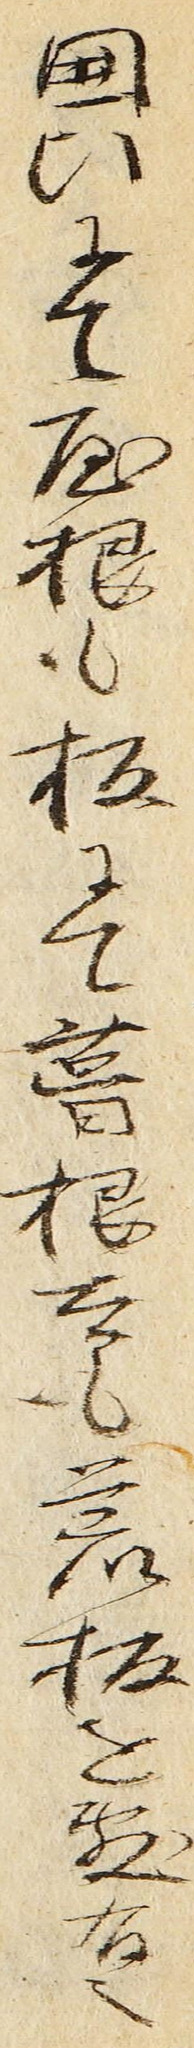囲ひにて屋根も板にて葺根太も荒板を敷有之
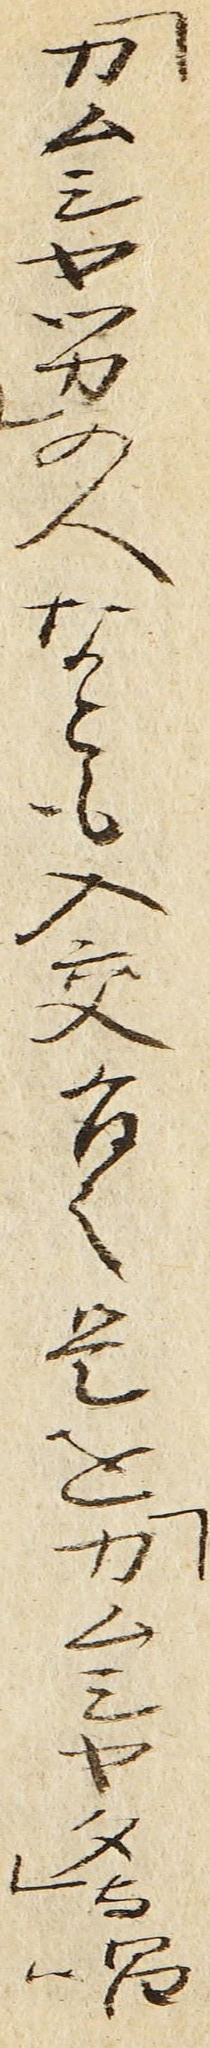「カムシヤツカ」の人なとも入交有之是を「カムシヤタ」と唱
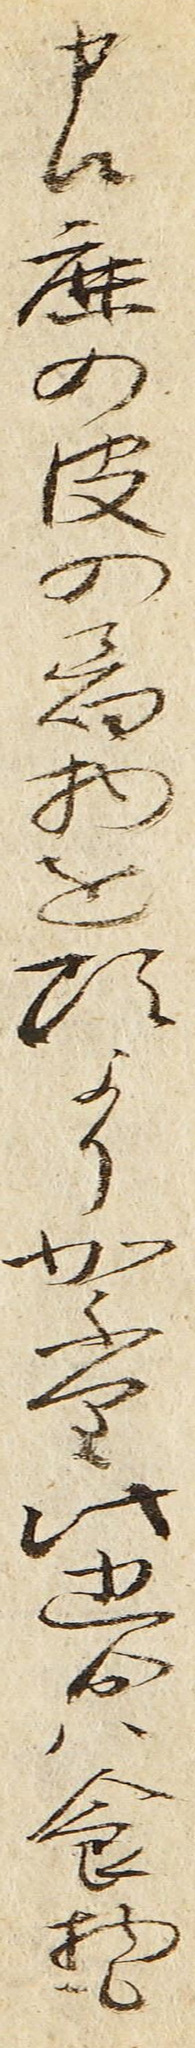申候鹿の皮の着物を頭よりかふり此辺ゟは食物も
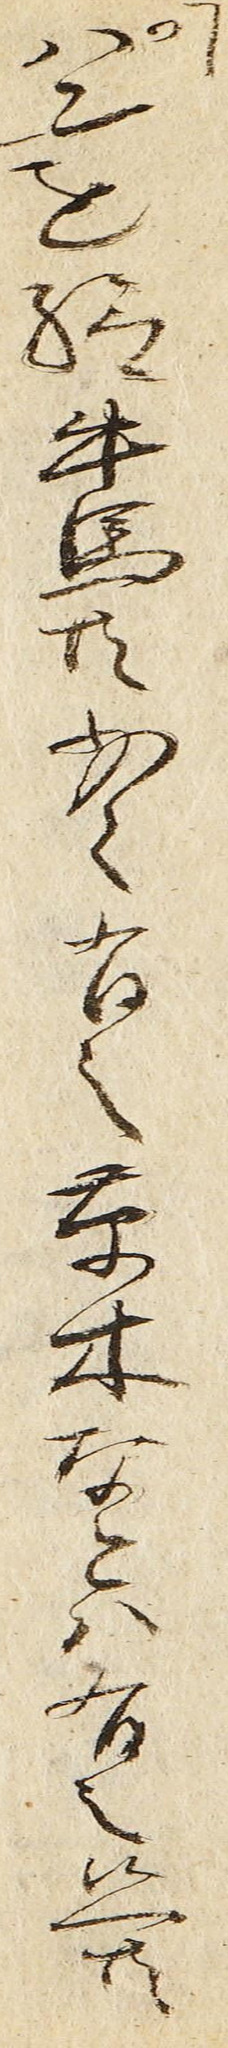「パン」を給牛馬共少く有之草木なとは有之候へ共
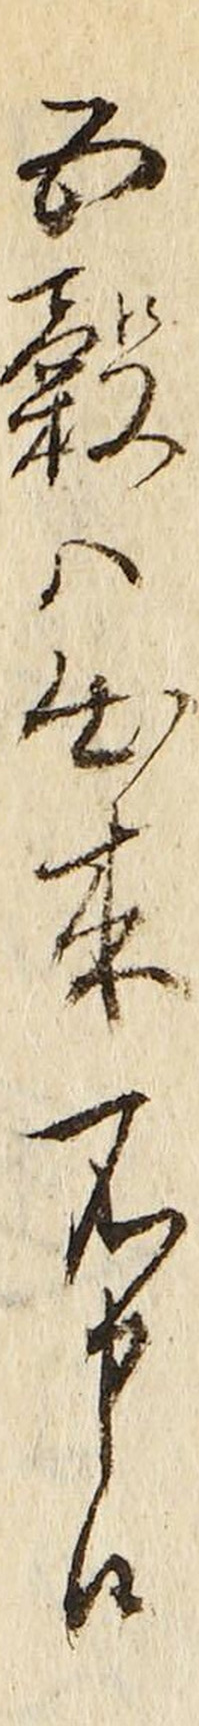五穀は出来不申候
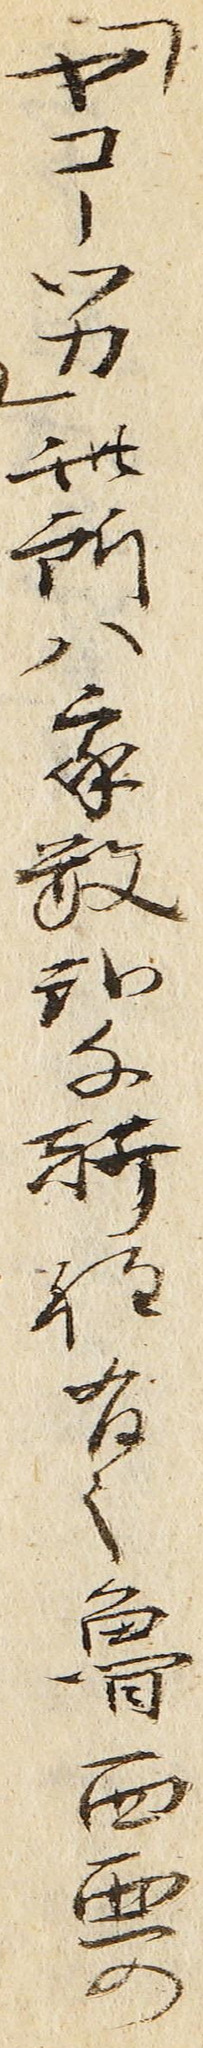「ヤコーツカ」此所は家数弐千軒程有之魯西亜の
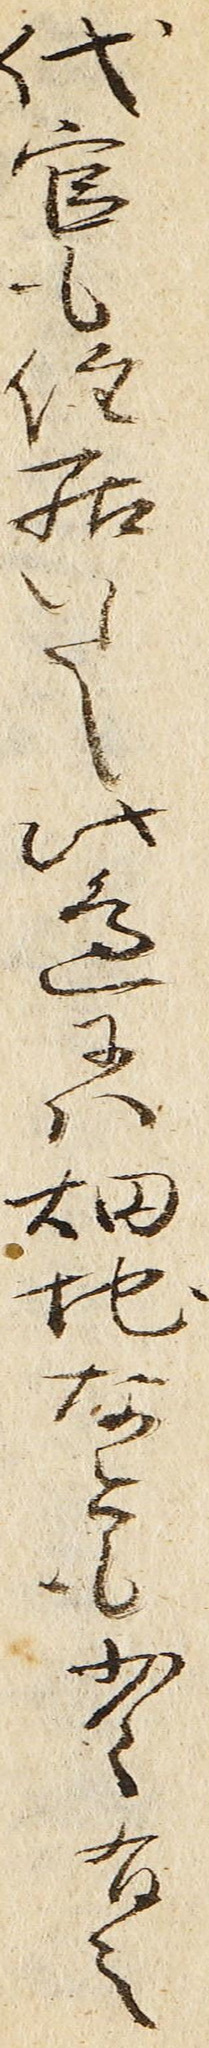代官も住居いたし此辺には畑地なとも少く有之
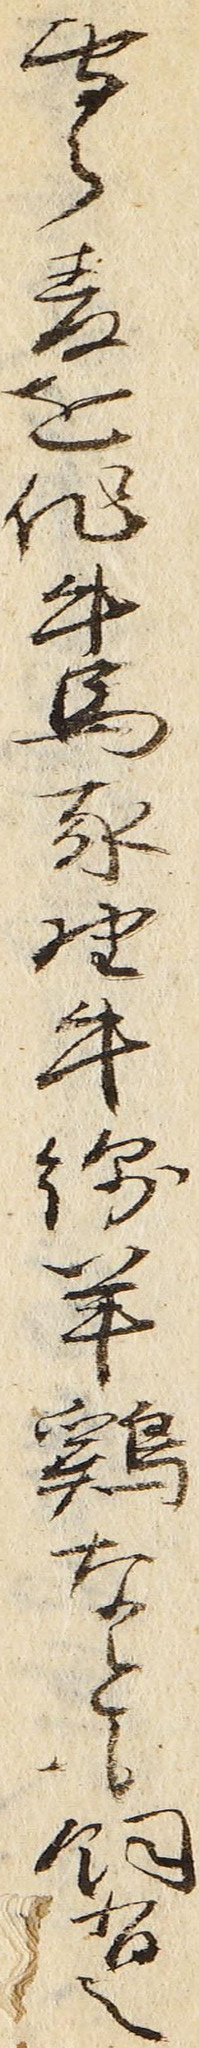専ら麦を作牛馬豕野牛綿羊鶏なとも飼有之
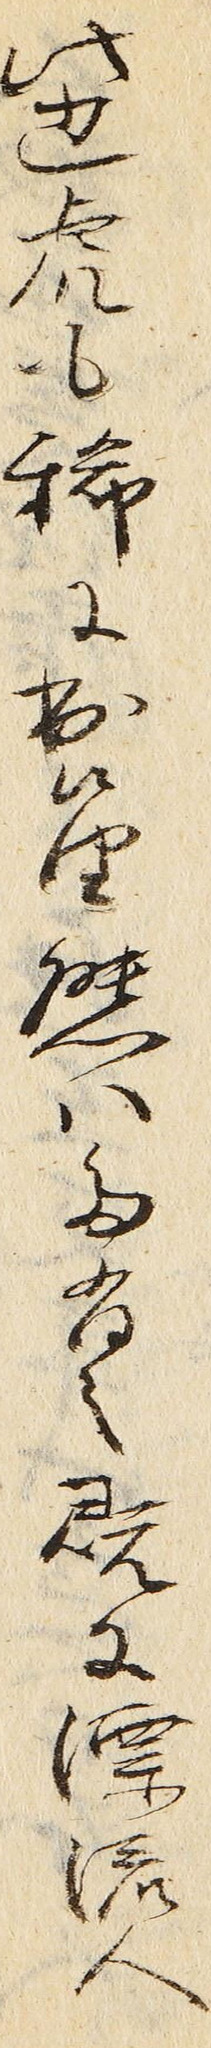此辺虎も稀に出候由熊は多有之既に漂流人
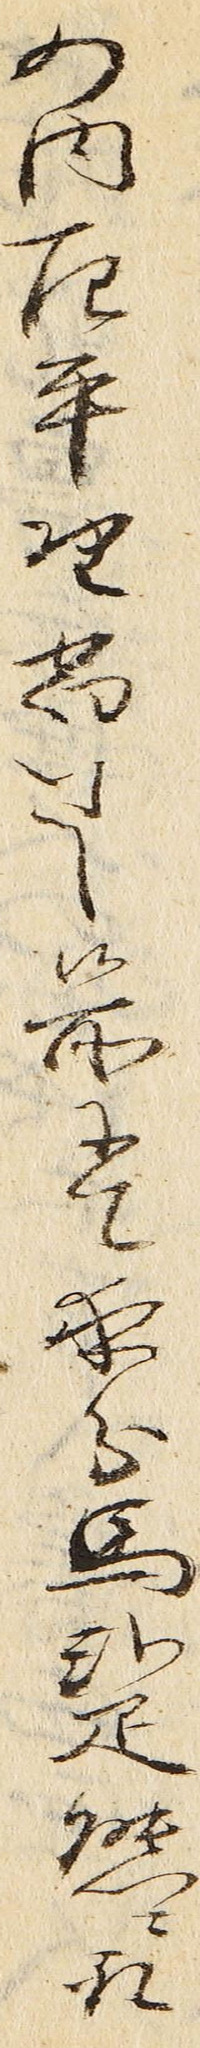の内左平野宿いたし候所にて夜分馬弐疋熊に取
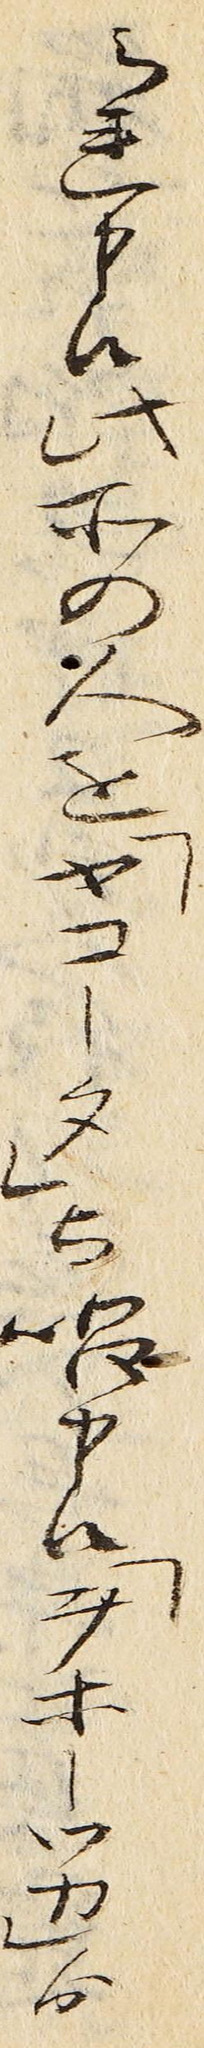られ申候此所の人を「ヤコータ」と唱申候「ヲホーツカ」ゟ
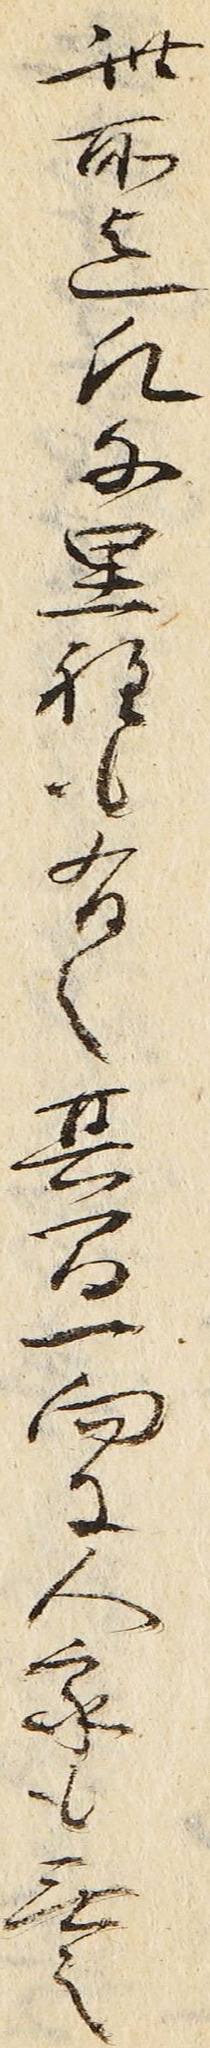此所迄凡千里程も有之其間一向に人家も無之
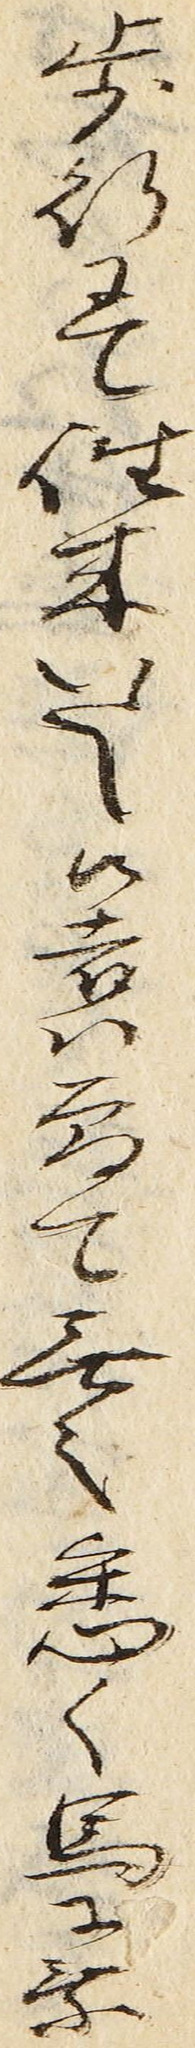歩行にて往来いたし候者は曽て無之悉く馬に乗
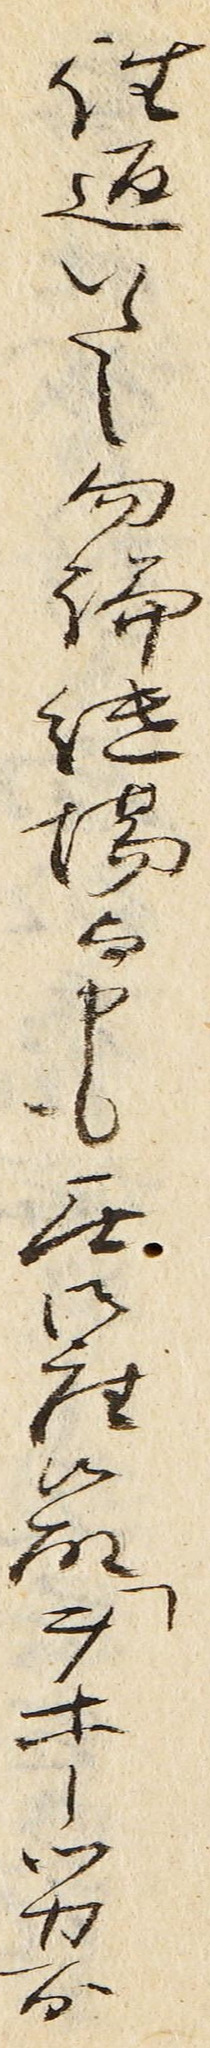往返いたし勿論継場と申も無御座候故「ヲホーツカ」ゟ
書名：漂民後記
